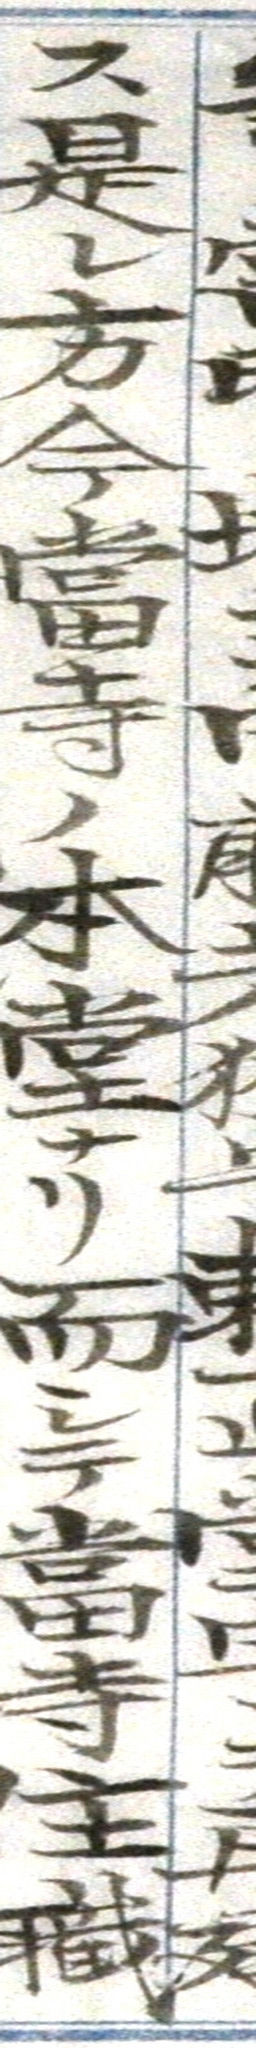ス是レ方今当寺ノ本堂ナリ而シテ当寺住職
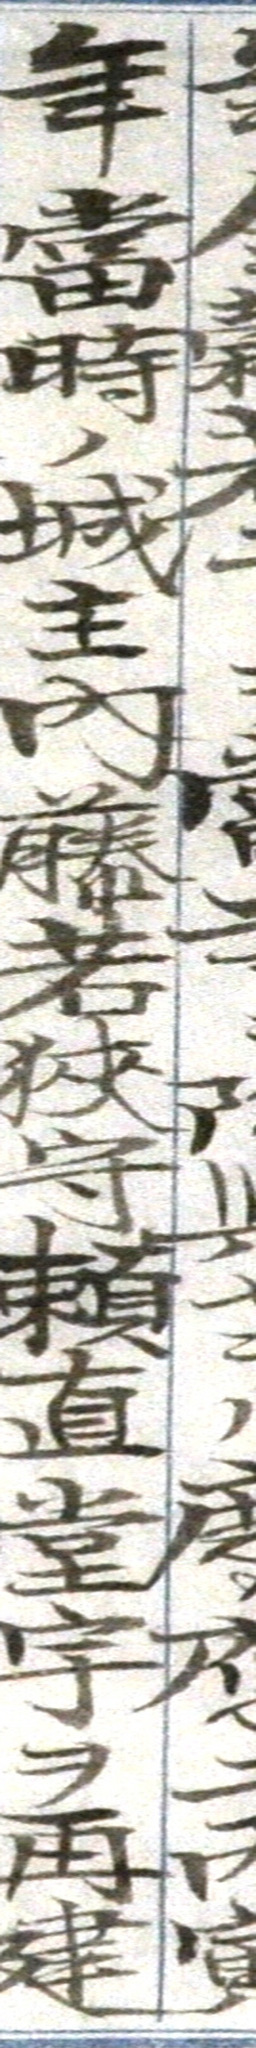年当時ノ城主内藤若狭守頼直堂宇ヲ再建
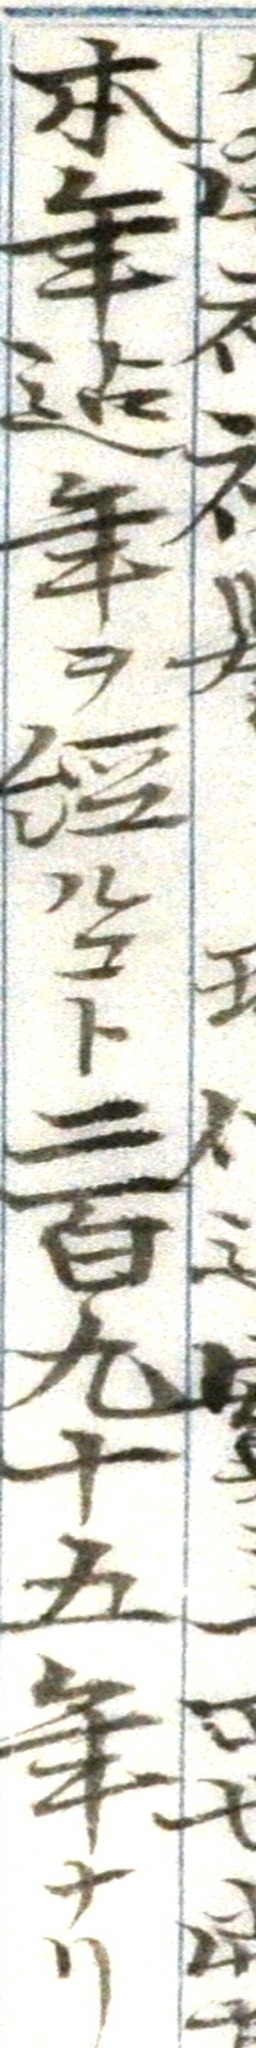本年迄ヲ経ルコト二百九十五年ナリ
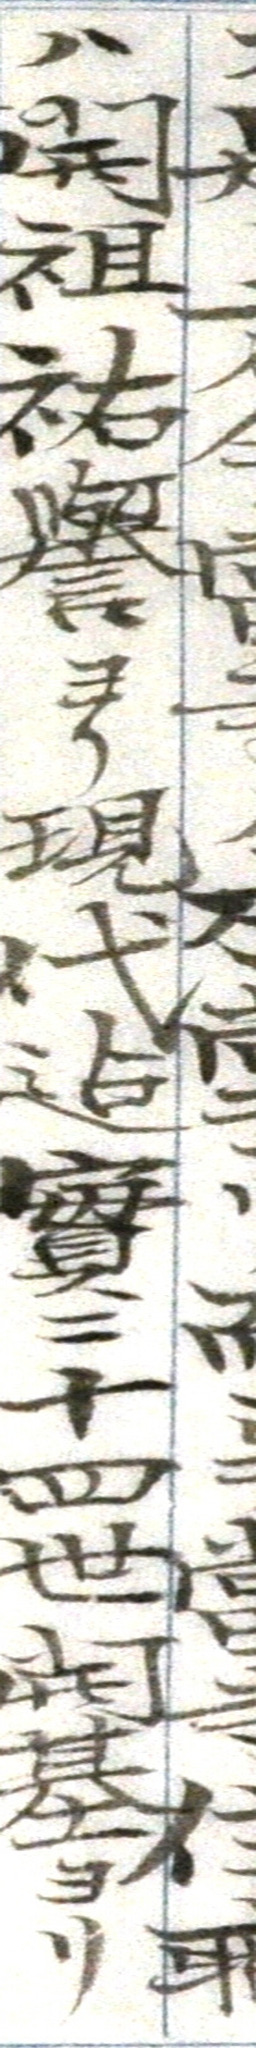ハ開基祐誉ヨリ現代迄実ニ十四世開基ヨリ
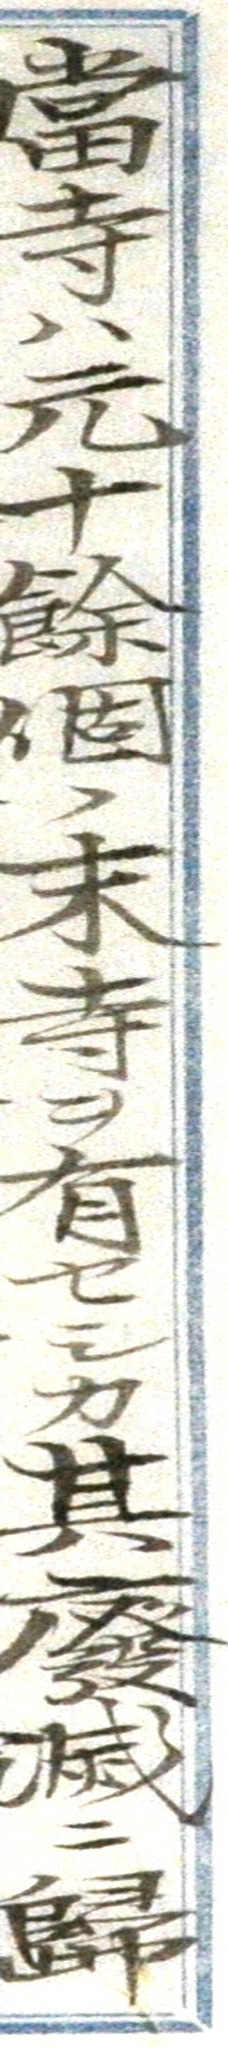当寺ハ元十余個ノ末寺ヲ有セシカ其廃滅ニ帰
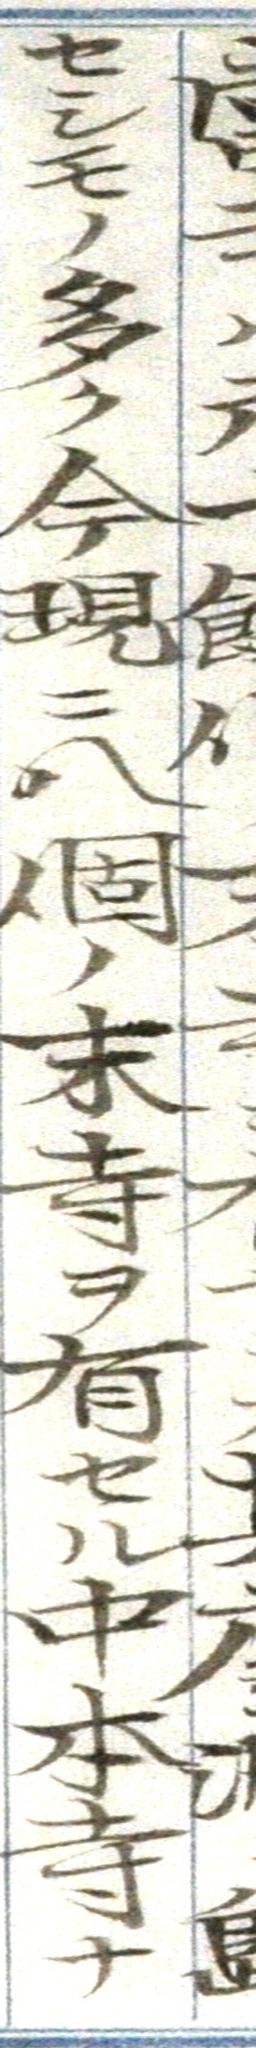セシモノ多ク今現ニ八個ノ末寺ヲ有セル中本寺ナ
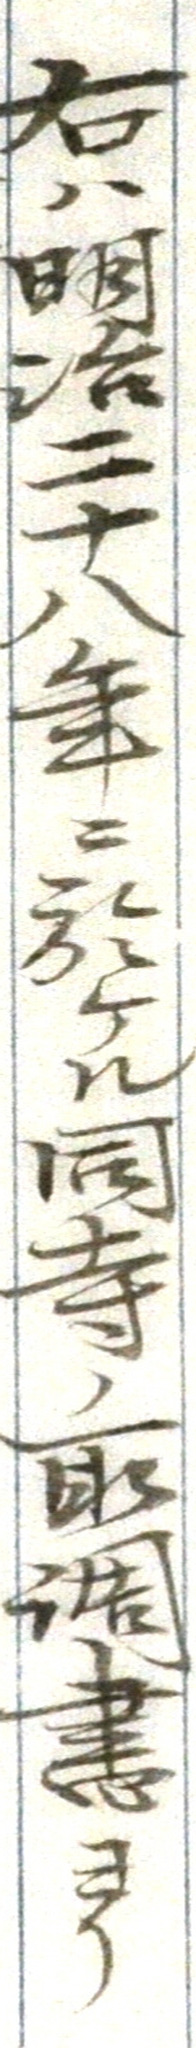右ハ明治二十八年ニ於ケル同寺ノ取調書ヨリ
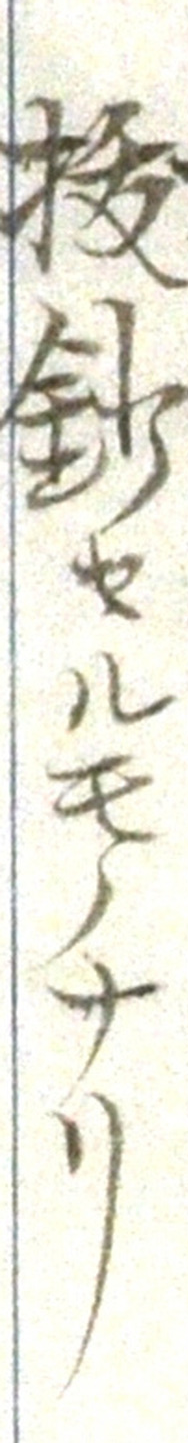抜鈔セルモノナリ

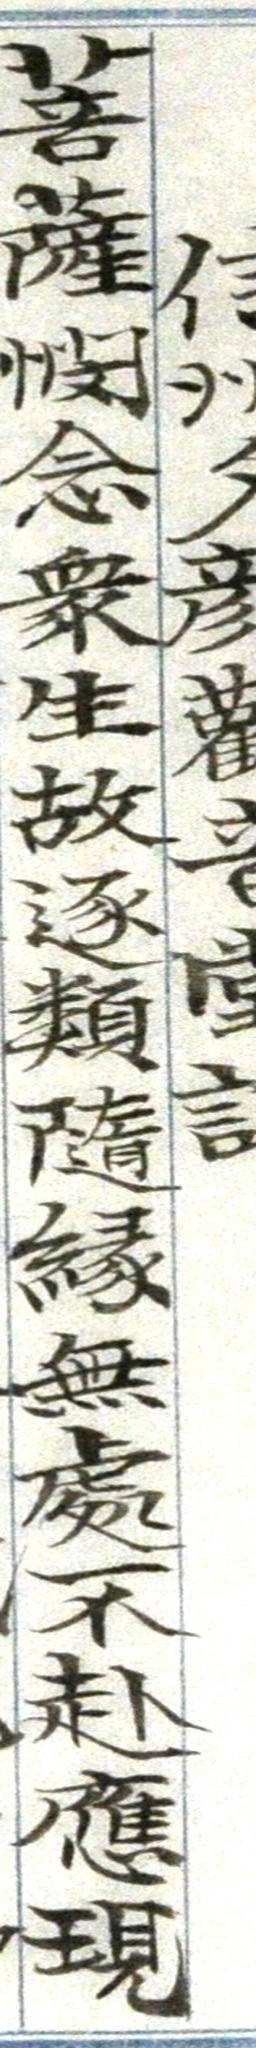菩薩憫念衆生故逐類隨縁無処不赴応現
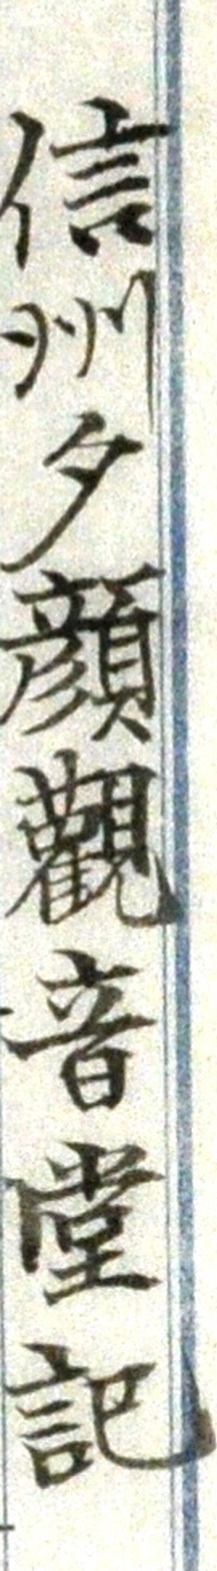信州夕顔観音堂記
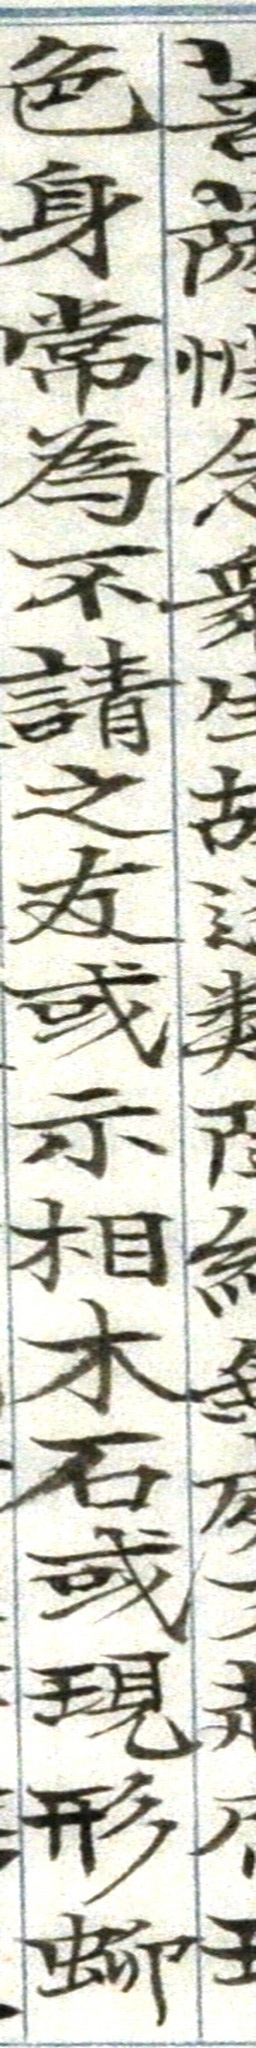色身常為不請之友或示相木石或現形
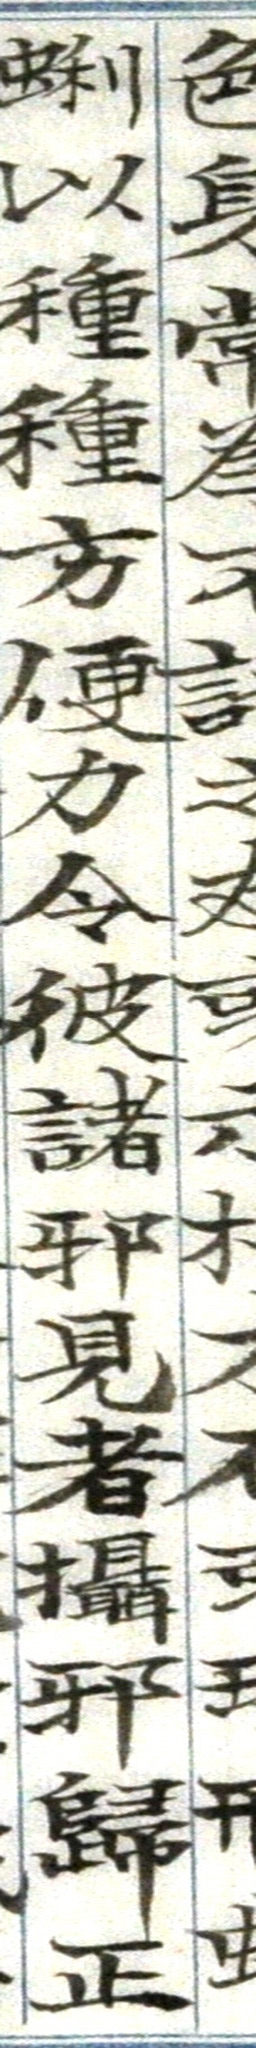蜊以種種方便力令彼諸邪見者摂邪帰正
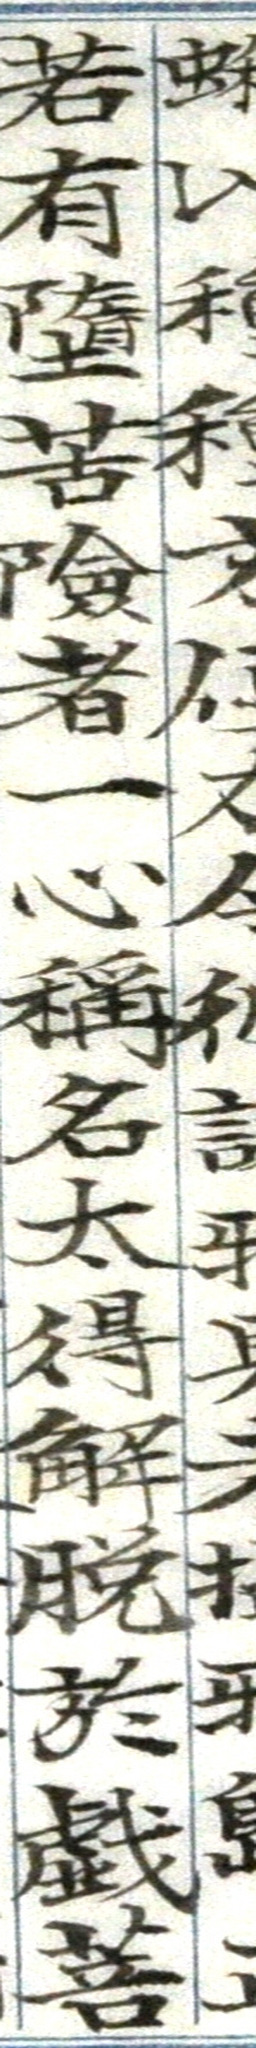若有堕苦険者一心称名太得解脱於戯菩
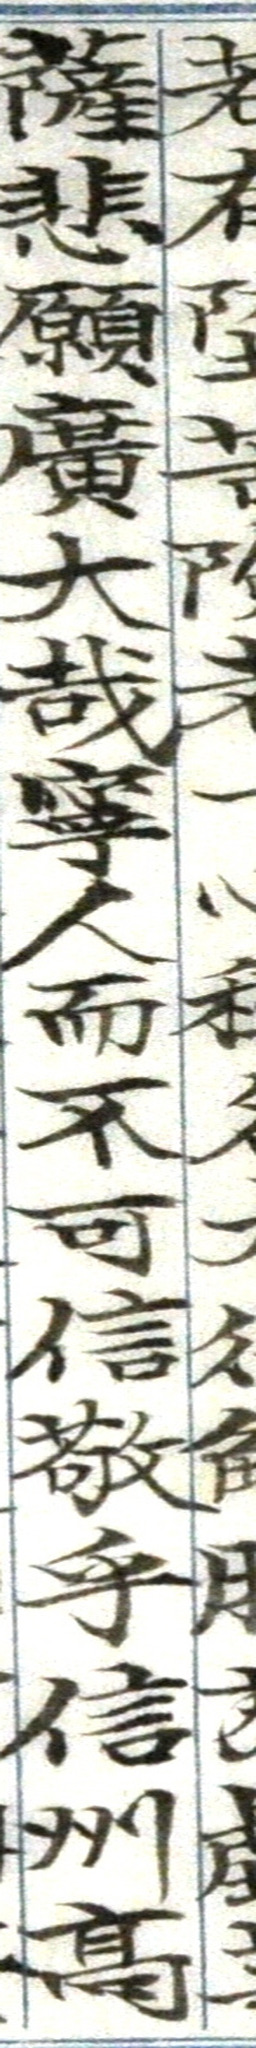薩悲願広大哉寧人而不可信敬乎信州高
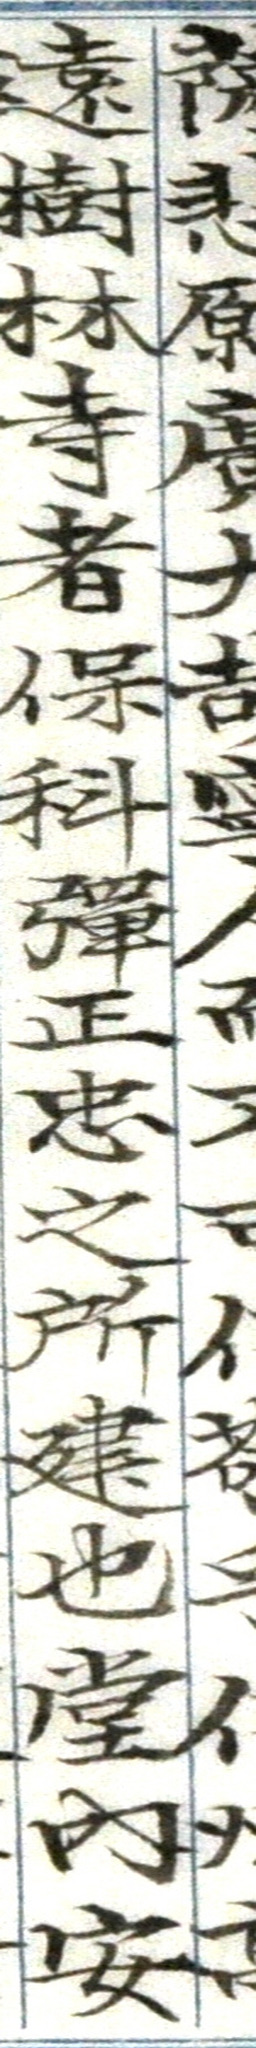遠樹林寺者保科弾正忠之所建也堂内安
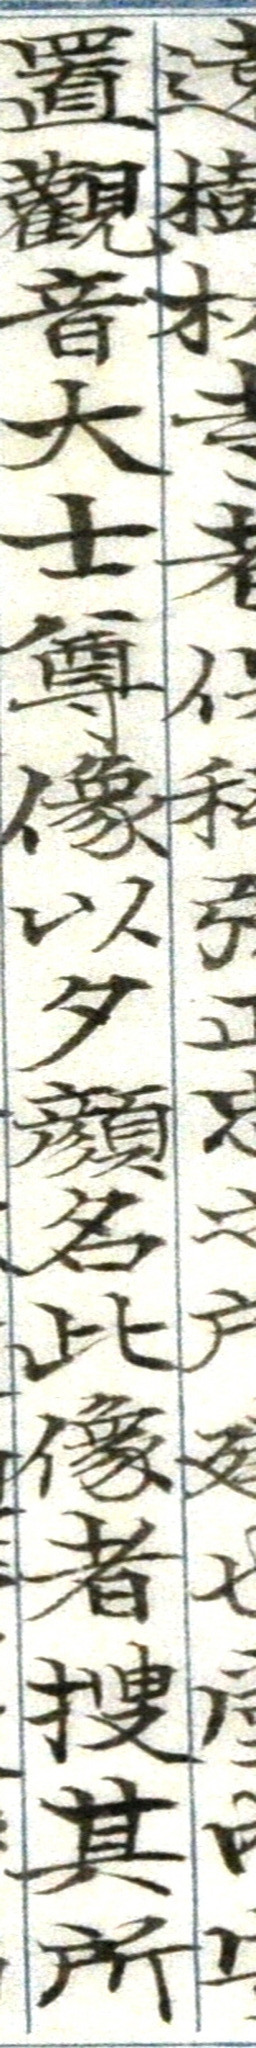置観音大士尊像以夕顔名此像者捜其所
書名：桂泉院・樹林寺・東光寺縁起書、蓮華寺由来書、付夕顔観音記
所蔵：伊那市立高遠町図書館・合同会社AMANE
